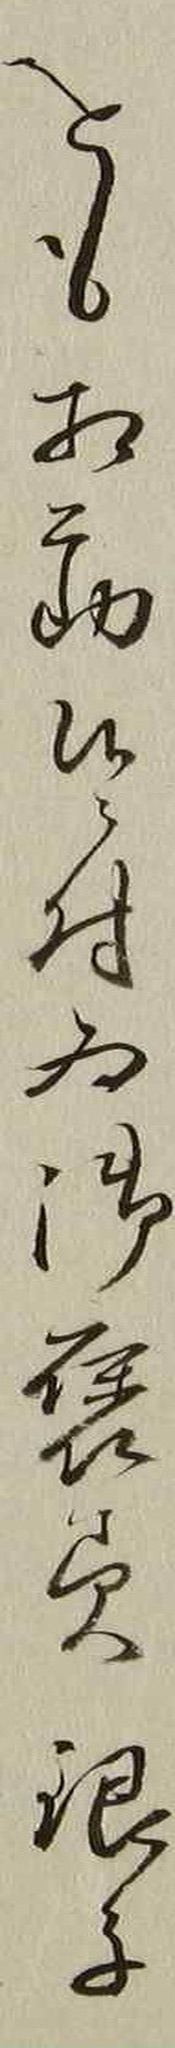をも相勤候ニ付為御褒美銀子
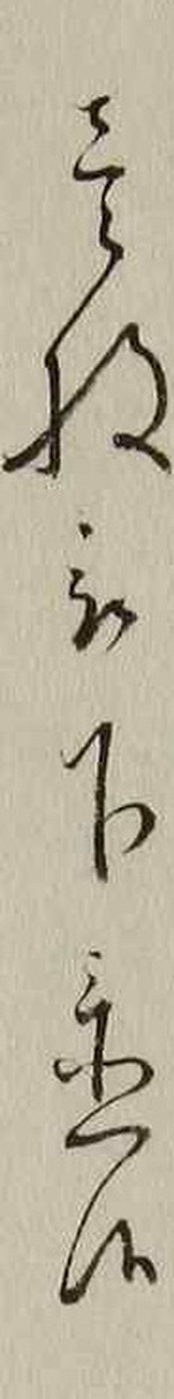壱枚被下置候
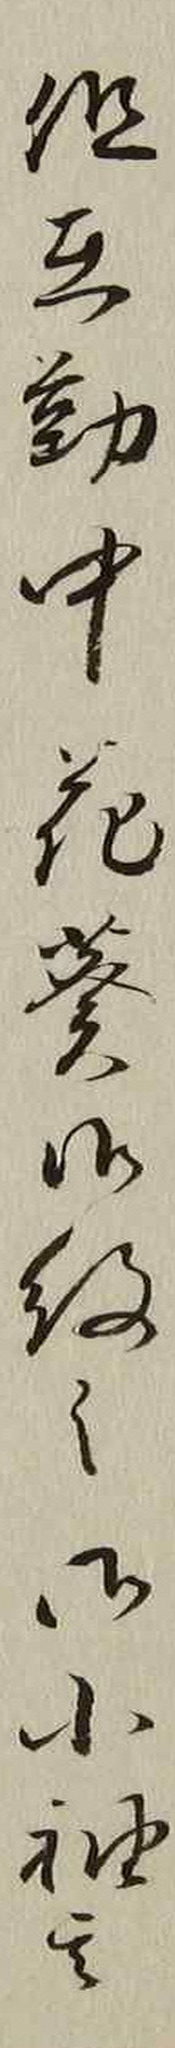但在勤中花葵御紋之御小袖壱
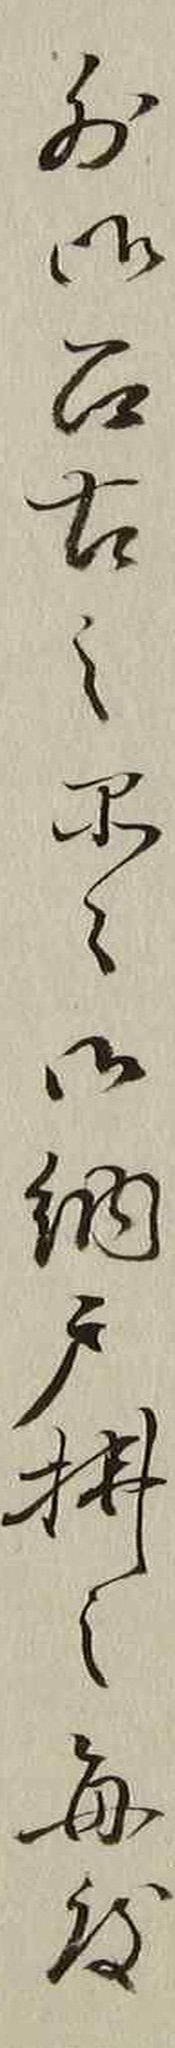外御召古之品々御納戸払之毎度
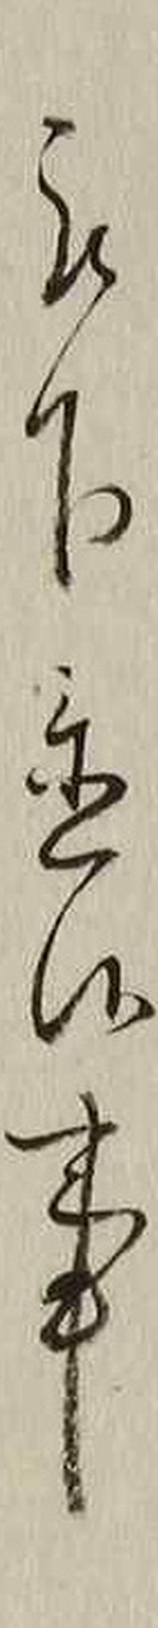被下置候事
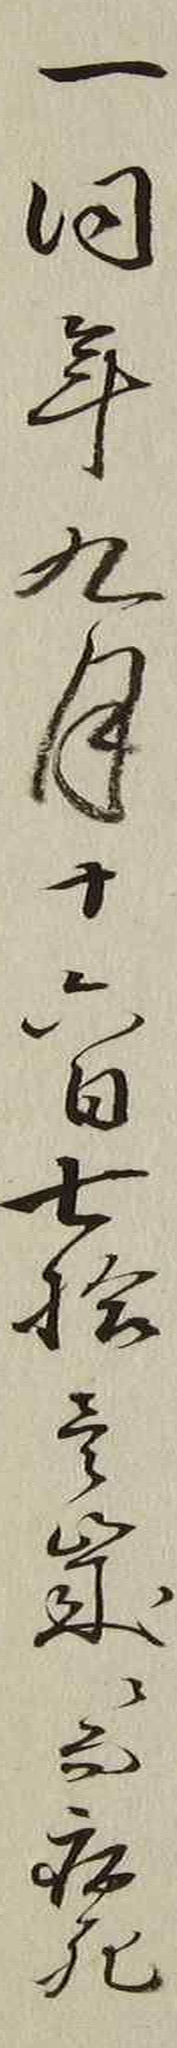一同年九月十六日七拾壱歳ニ而病死
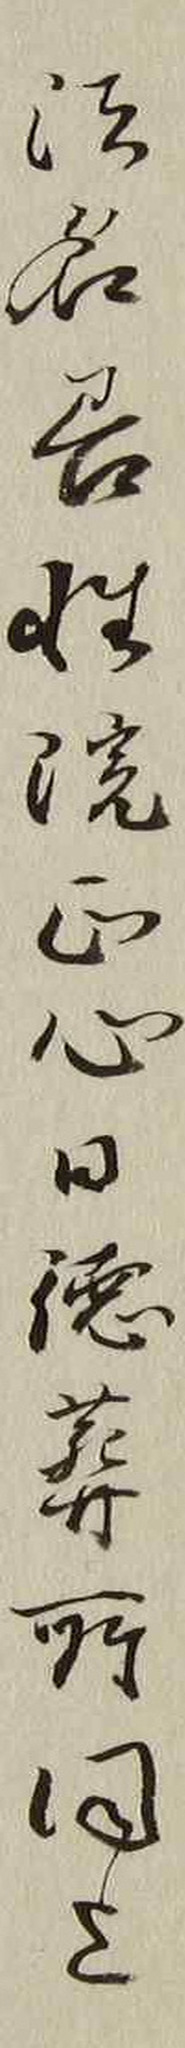法名善性院正心日徳葬所同上
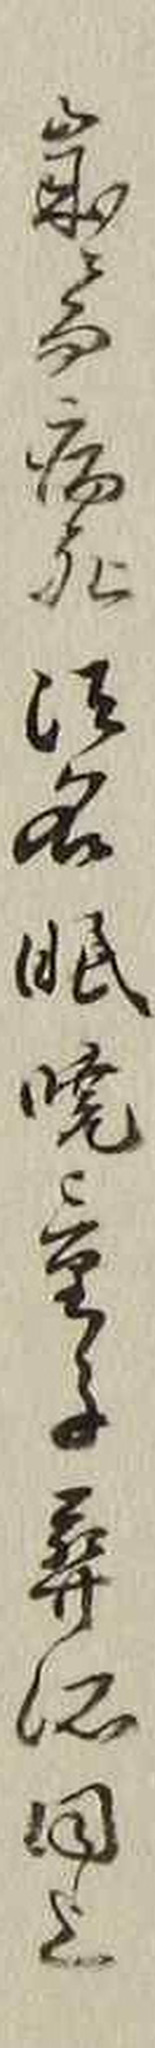歳ニ而病死法名眠暁童子葬所同上
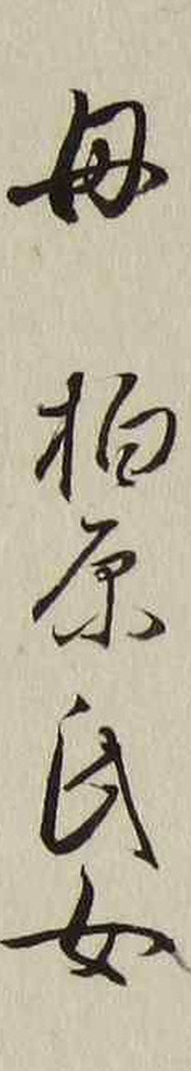母柏原氏女

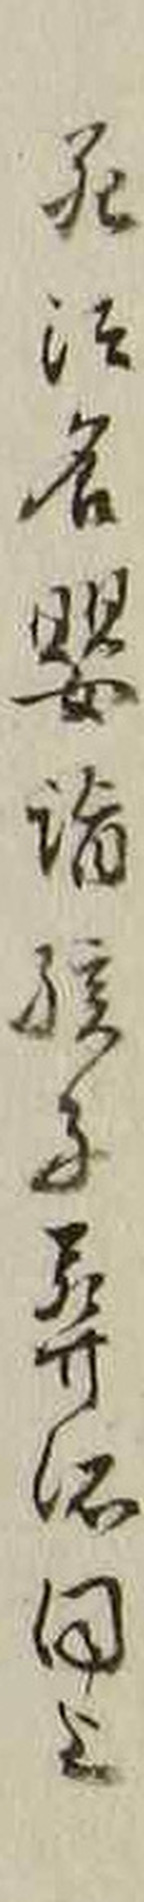死法名嬰詣孩子葬所同上
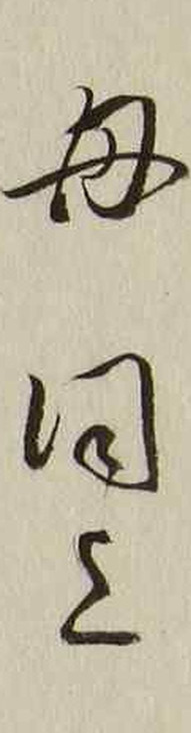母同上
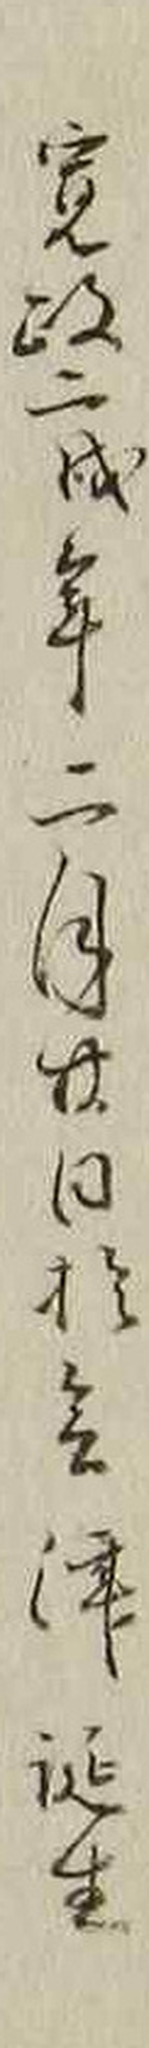寛政二戌年二月廿日於会津誕生
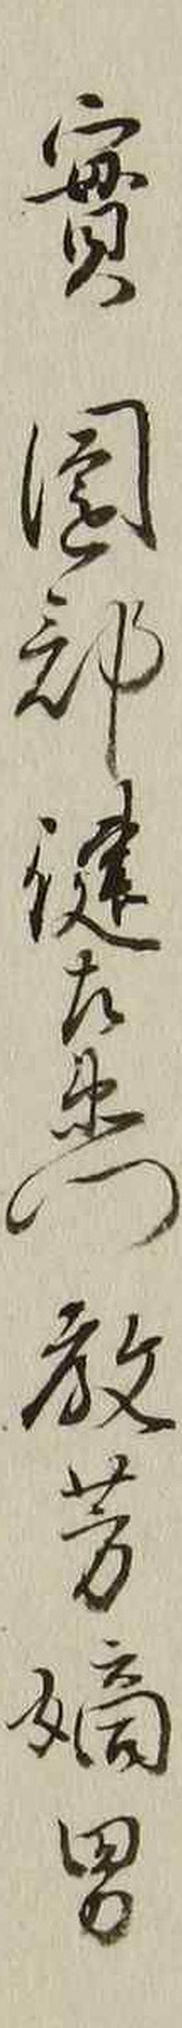実園部健左衛門教芳嫡男
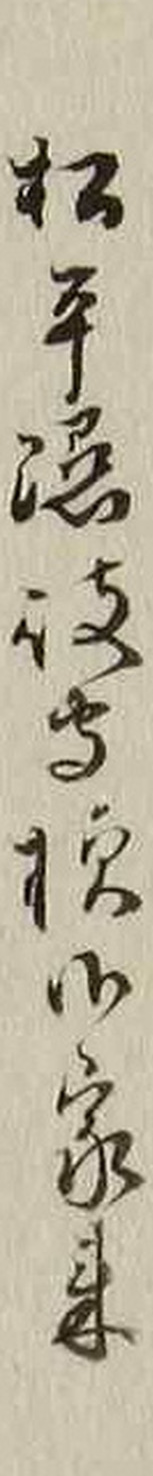松平隠岐守様御家来
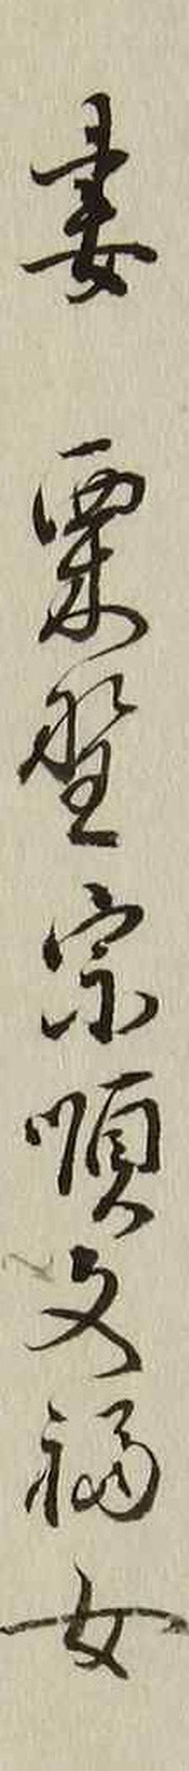妻栗野宗順文福女
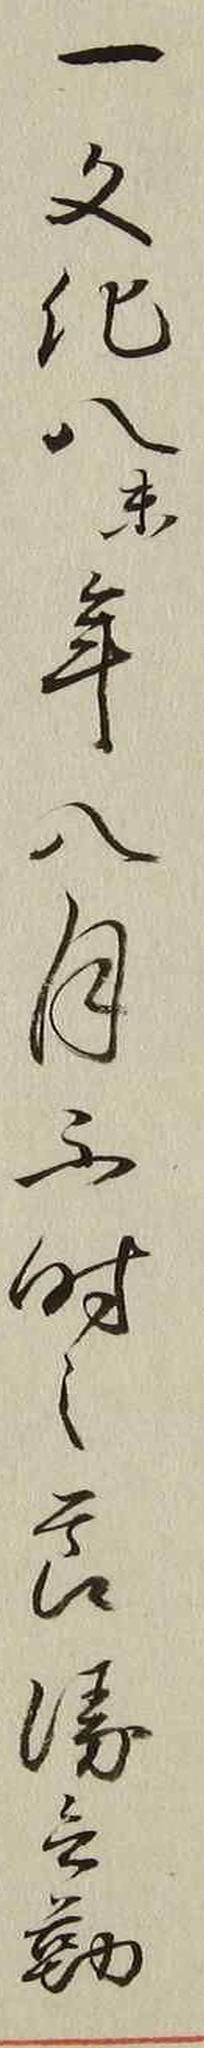一文化八未年八月不時之節衛兵勤
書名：諸士系譜　巻之4　い之部4
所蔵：会津若松市立会津図書館
